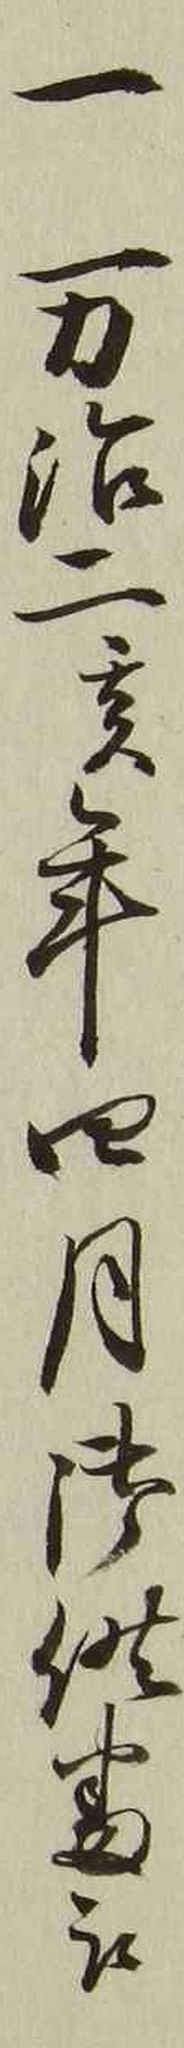一万治二亥年四月御供番被
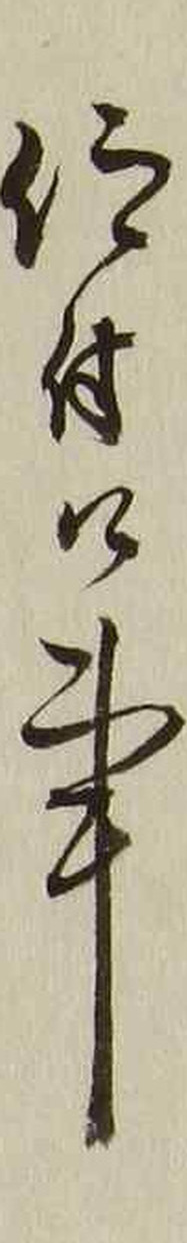仰付候事
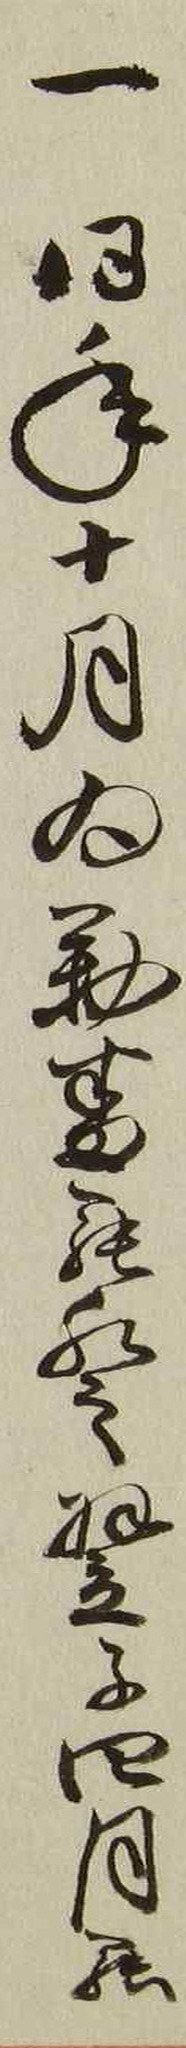一同年十月為勤番罷登翌子四月罷
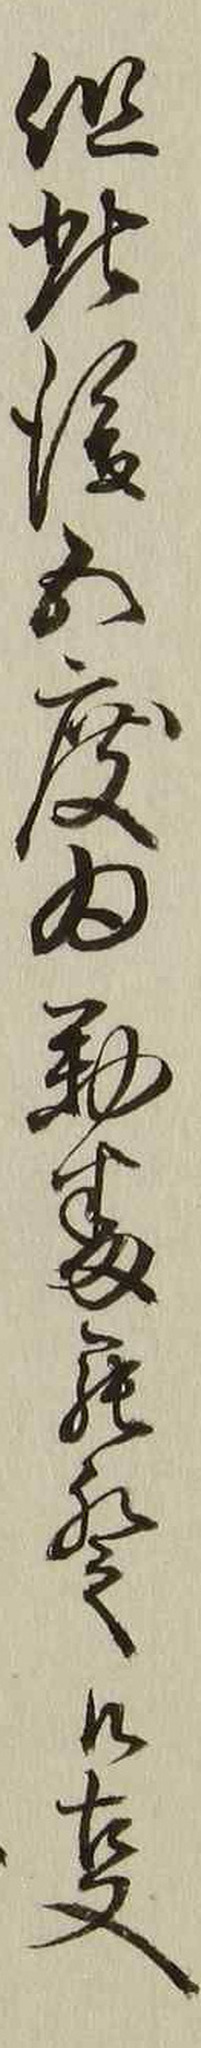但此後五度為勤番罷登候事
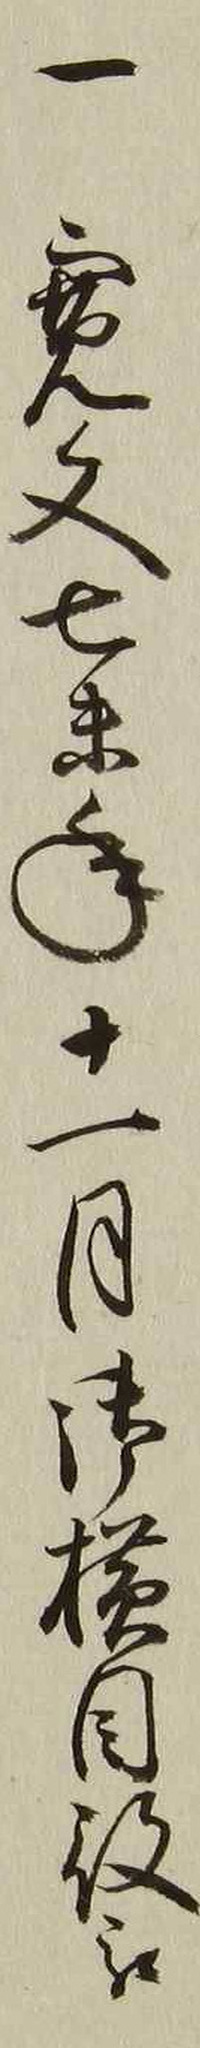一寛文七未年十一月御横目役被
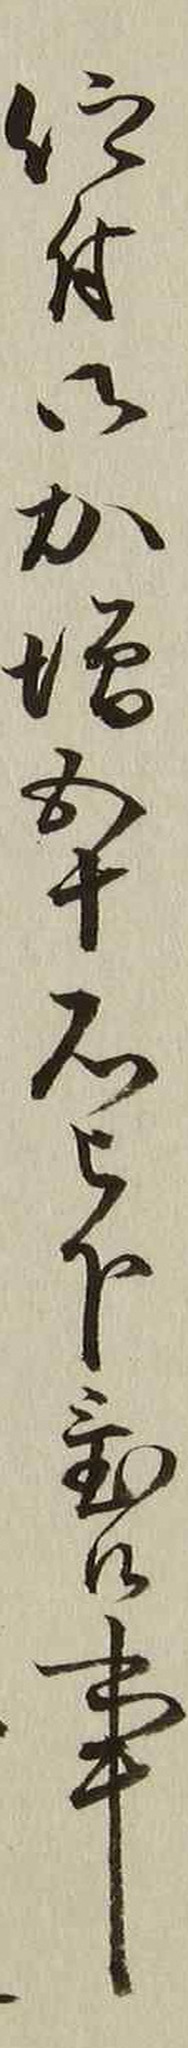仰付御加増五十石被下置候事
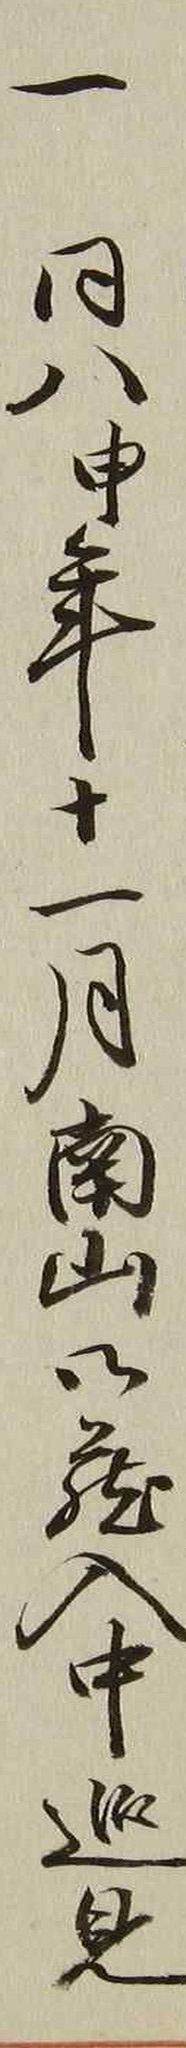一同八申年十一月南山御蔵入中巡見
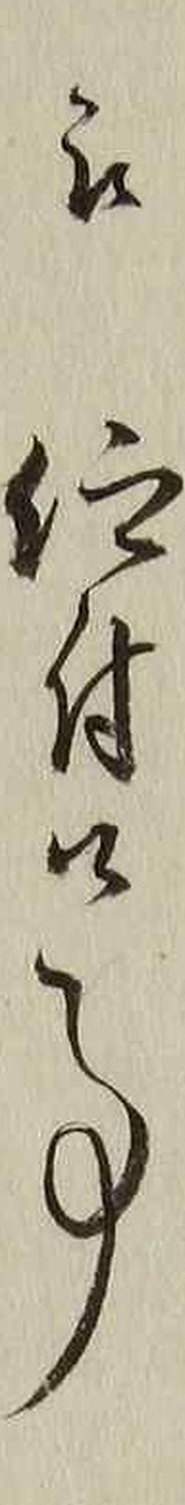被仰付候事
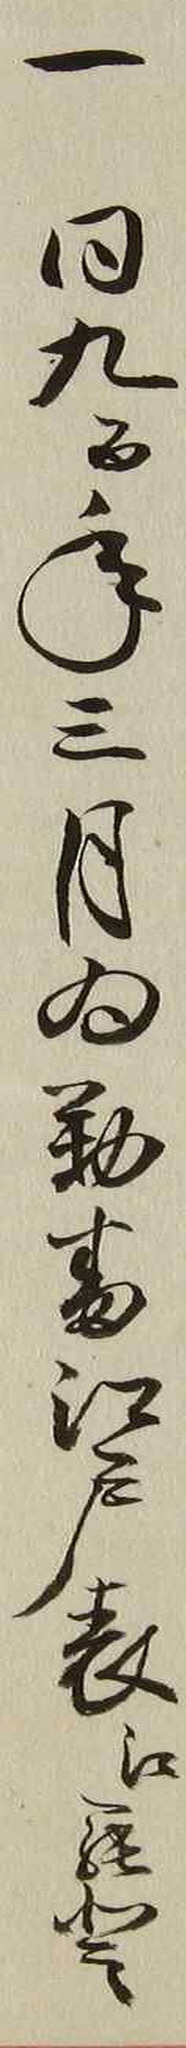一同九酉年三月為勤番江戸表江罷登
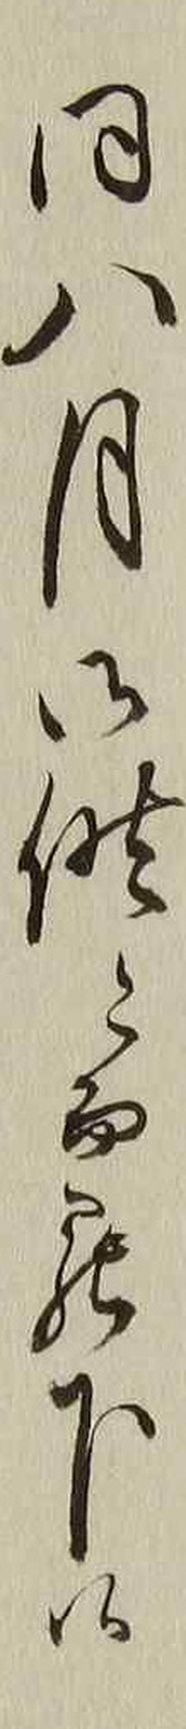同八月御供ニ而罷下候
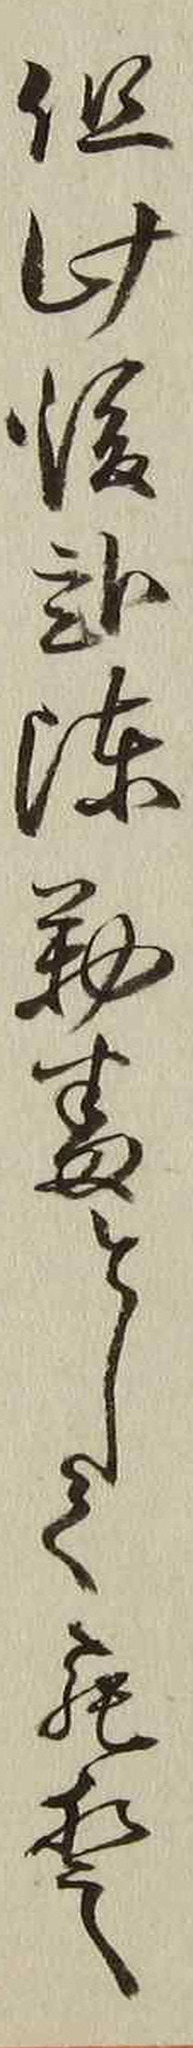但此後弐陣勤番として罷登
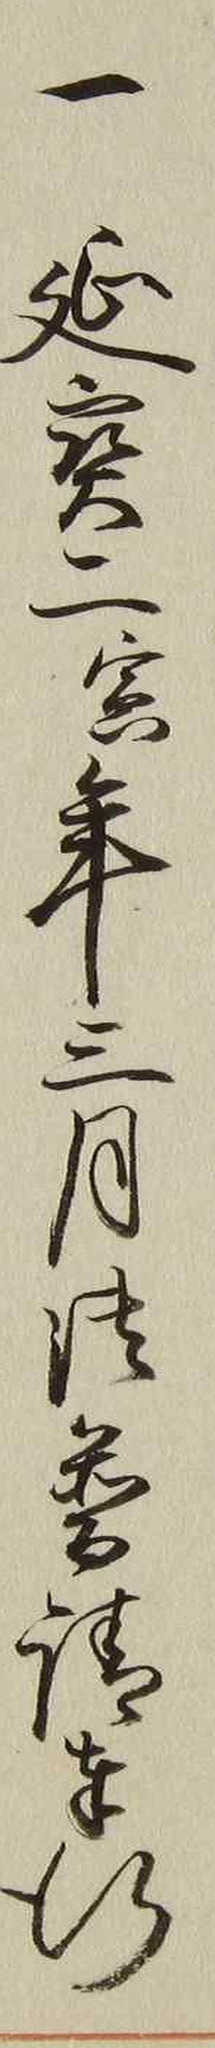一延宝二寅年三月御普請奉行
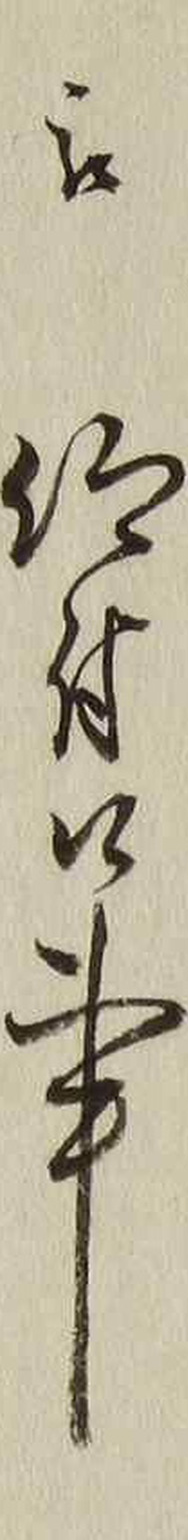被仰付候事
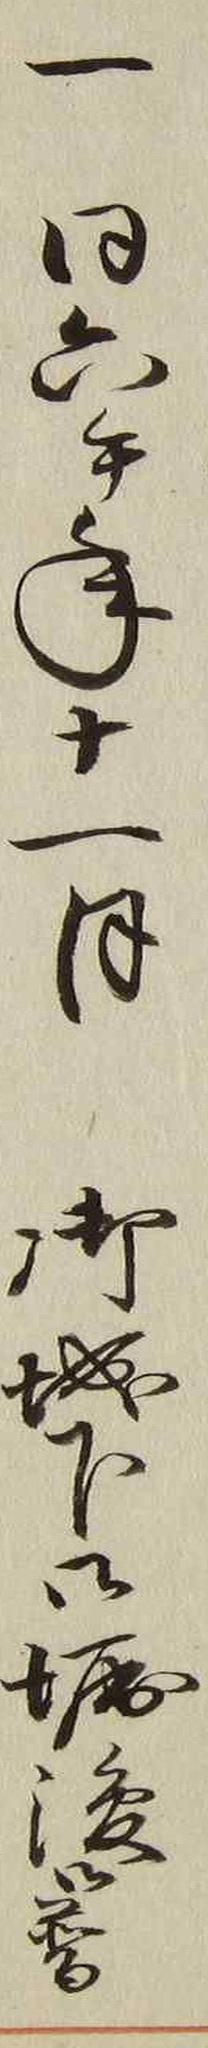一同六丑年十一月御城下御堀浚御普
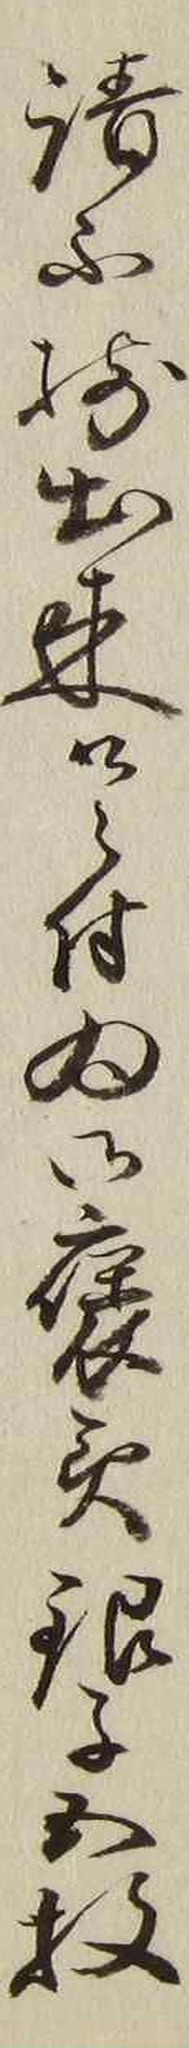請不揃出来候ニ付為御褒美銀子五枚
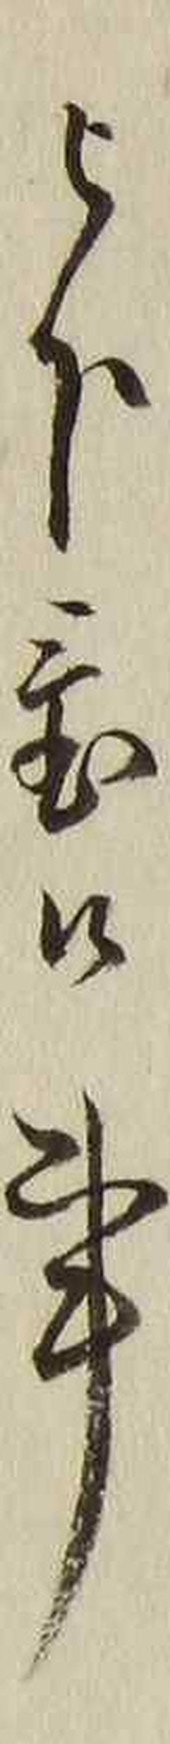被下置候事
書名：諸士系譜　巻之60　と之部3
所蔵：会津若松市立会津図書館
